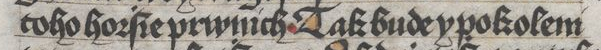toho horẛie prwních.Tak bude y pokolení
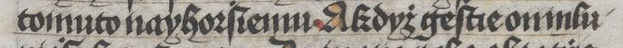tomuto nayhorẛiemu.Akdyż geẛtie on mlu¬
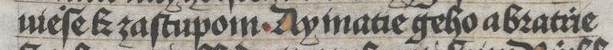uíeẛe k zaſtupom.Ay matie geho a bratṙie
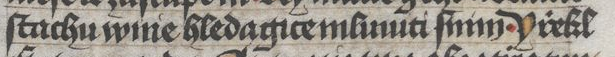ſtachu wnie hledagíce mluuiti ſnim.Yṙekl
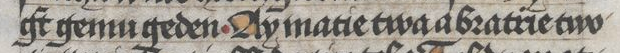ḡt gemu geden.Ay matie twa a bratṙie two¬
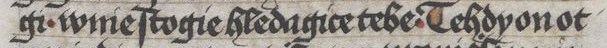gi.wnie ſtogie hledagíce tebe.Tehdy on ot¬
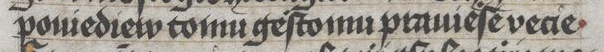pouiediew tomu geẛto mu prawíeẛe vecie.
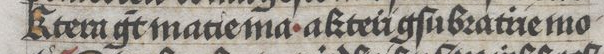Ktera ḡt matie ma.a kteṙi gſu bratṙie mo¬
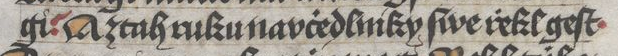gi?A ztah ruku navċedlníky ſwe ṙekl geſt.
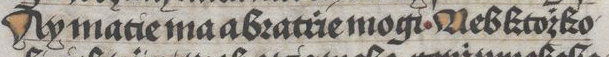Ay matie ma a bratṙie mogi.Neb ktożko¬
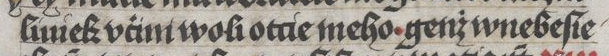liuiek vċini woli otcie meho.genż wnebeſie¬
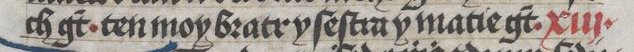ch ḡt.ten moy bratr y ſeſtra y matie ḡt.xiij.
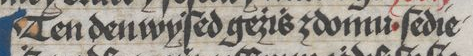Ten den wyẛed geżiṡ zdomu.ſedíe¬
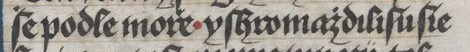ẛe podle moṙe.yſhromażdili ſu ſie
